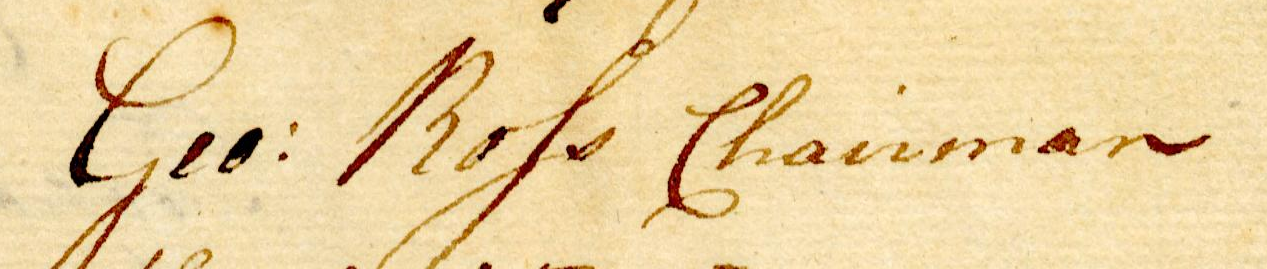Geo: Ross Chairman
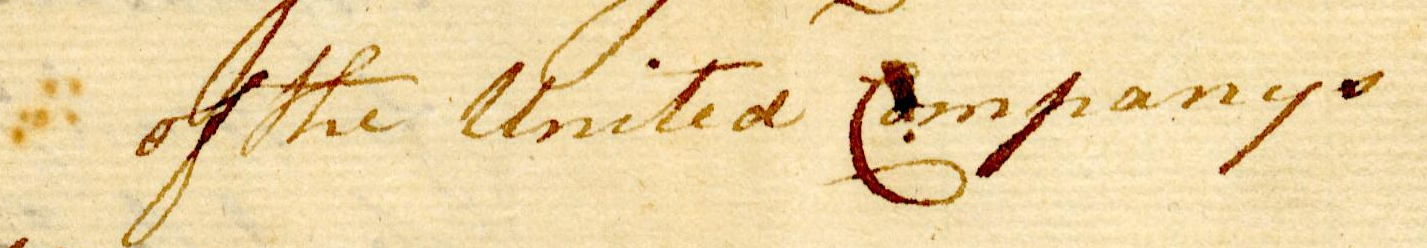of the United Company's
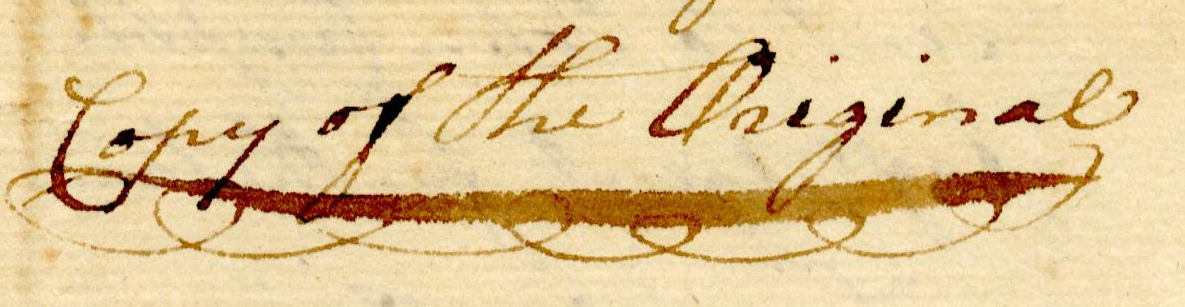Copy of the Original
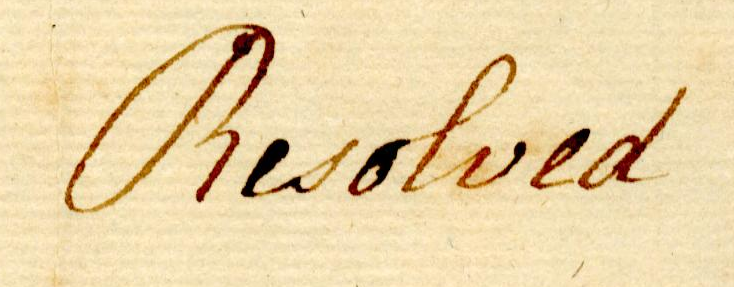Resolved
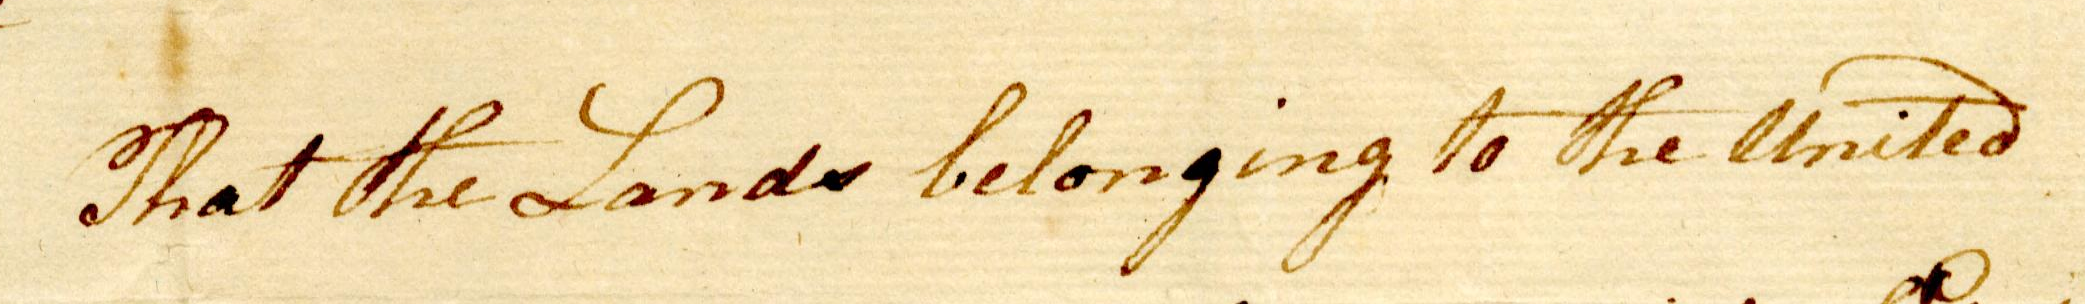That the Lands belonging to the United
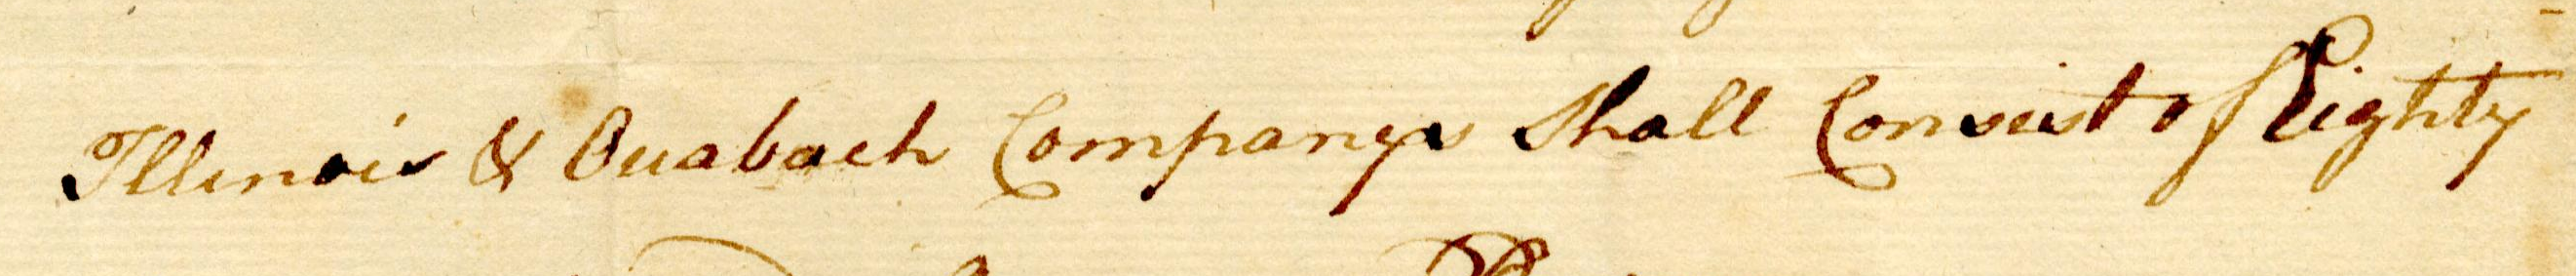Illinois & Ouabach Company shall Consist of Eighty
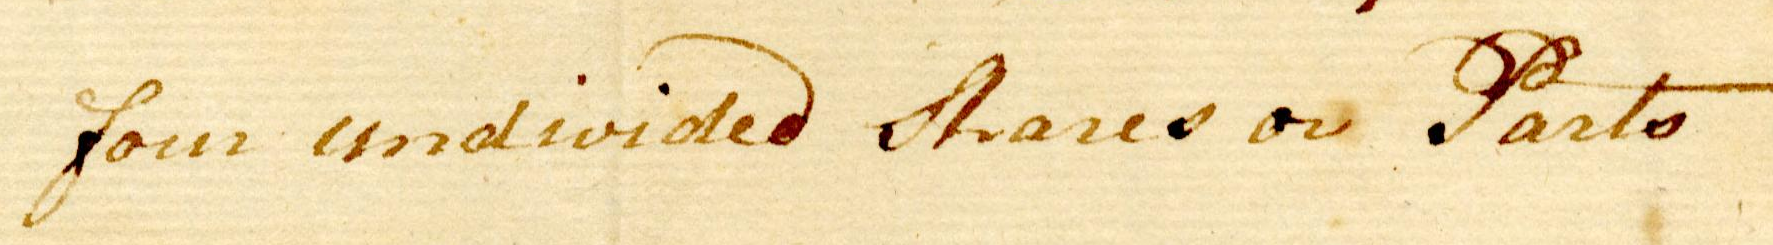four undivided Shares or Parts
